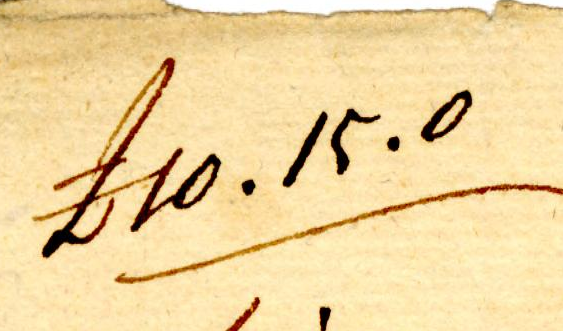£10. 15.0
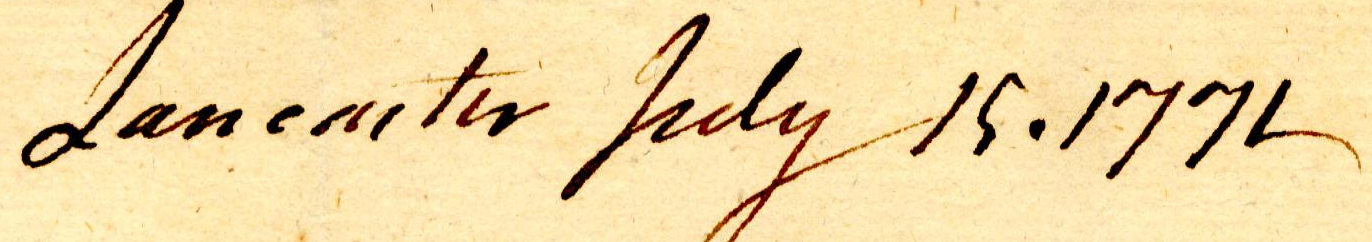Lancaster July 15. 1771
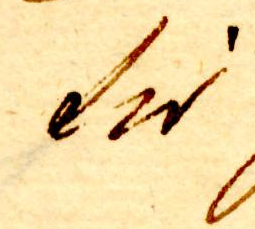Sir
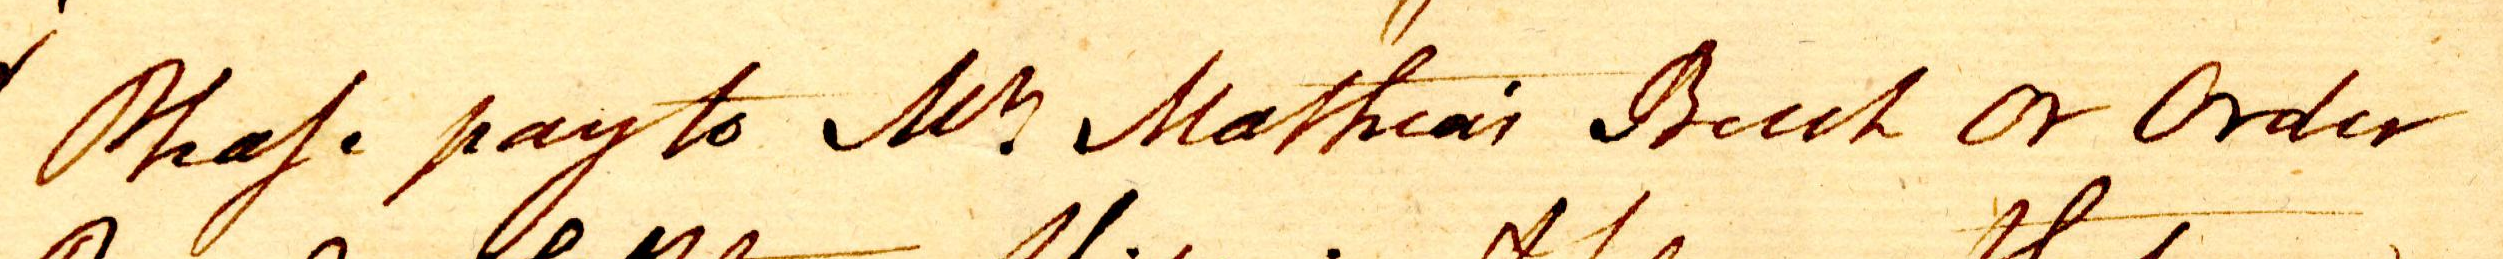Please pay to M^r. Mathias Bush or Order
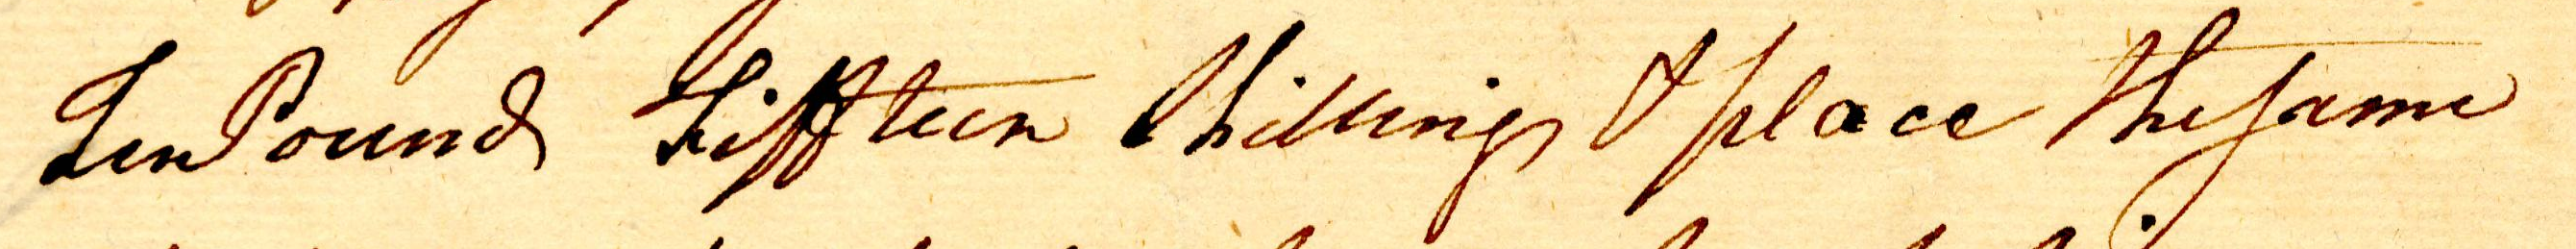Ten Pound Fiffteen Shillings & place the same
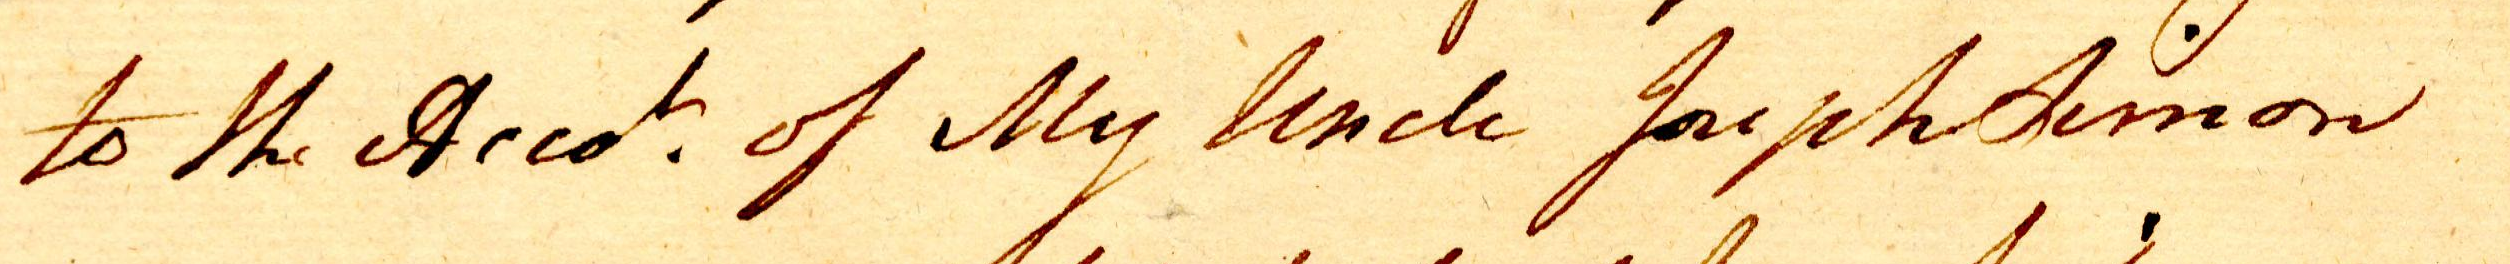to the Acco^t. of My Uncle Joseph Simon
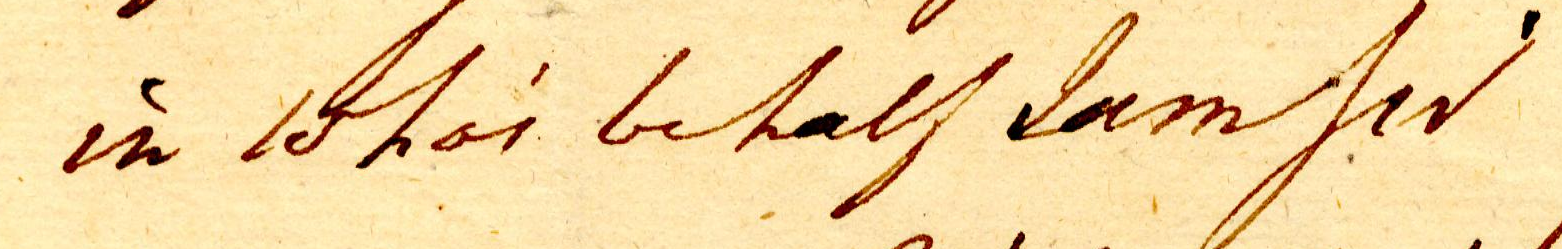in who's behalf I am Sir
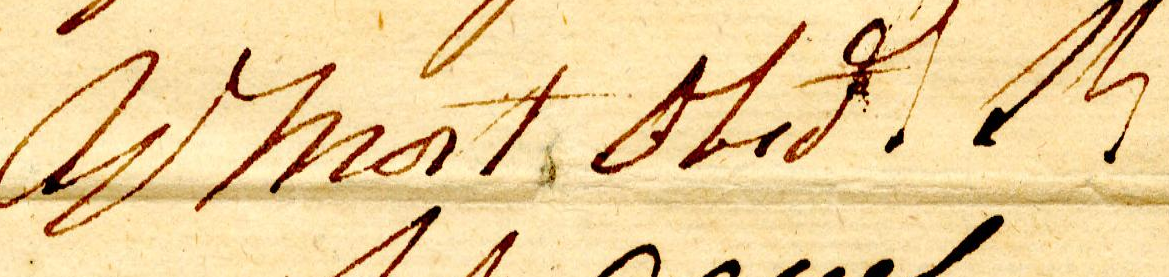Y^e Most Obed^t. s^t
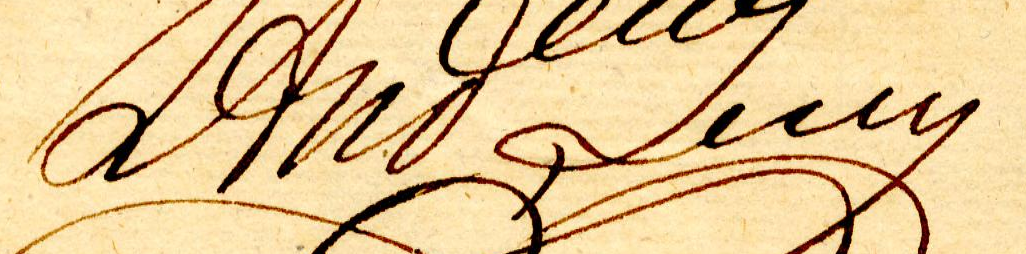And^rew Levy
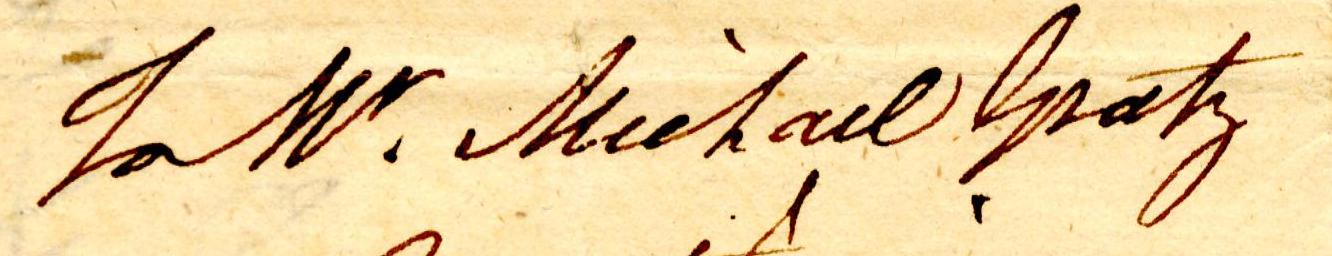to M^r. Michael Gatz
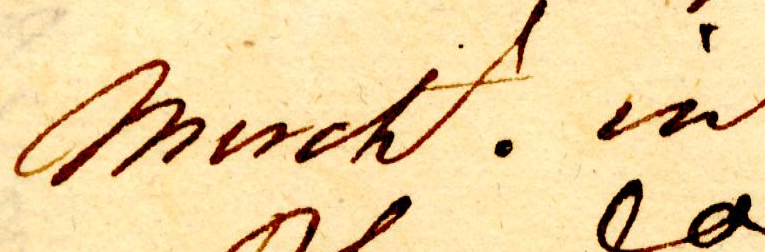Merch^t in
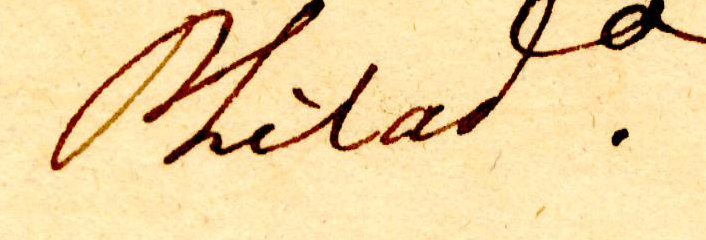Philad^a
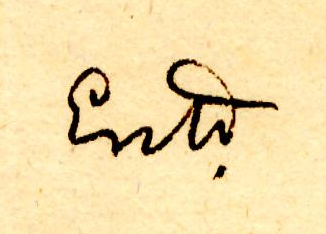Entd.
